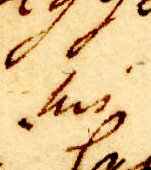his
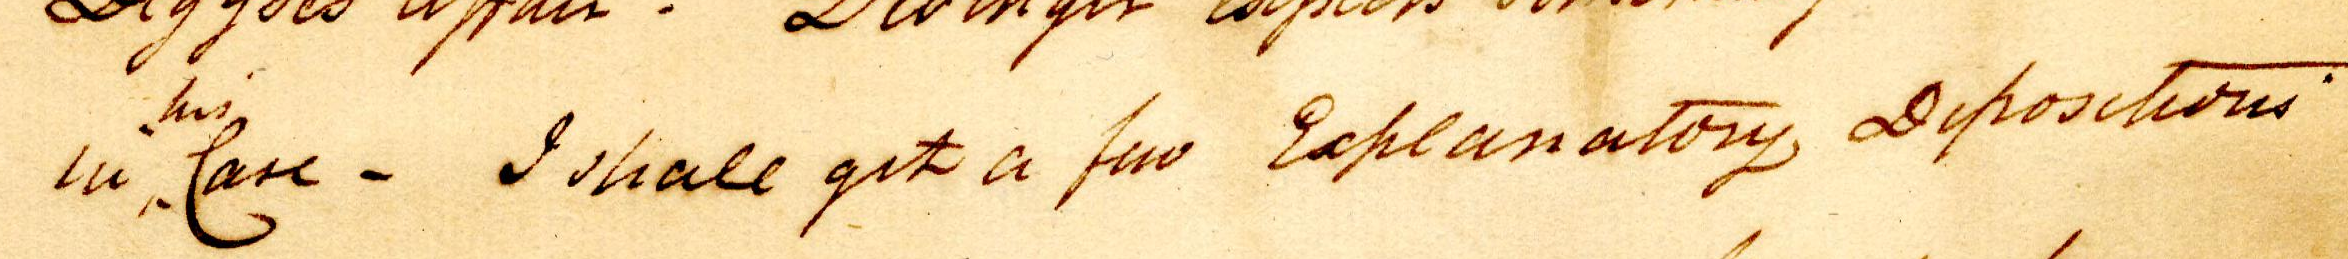in ^ Case. I shall get a few Explanatory Depositions
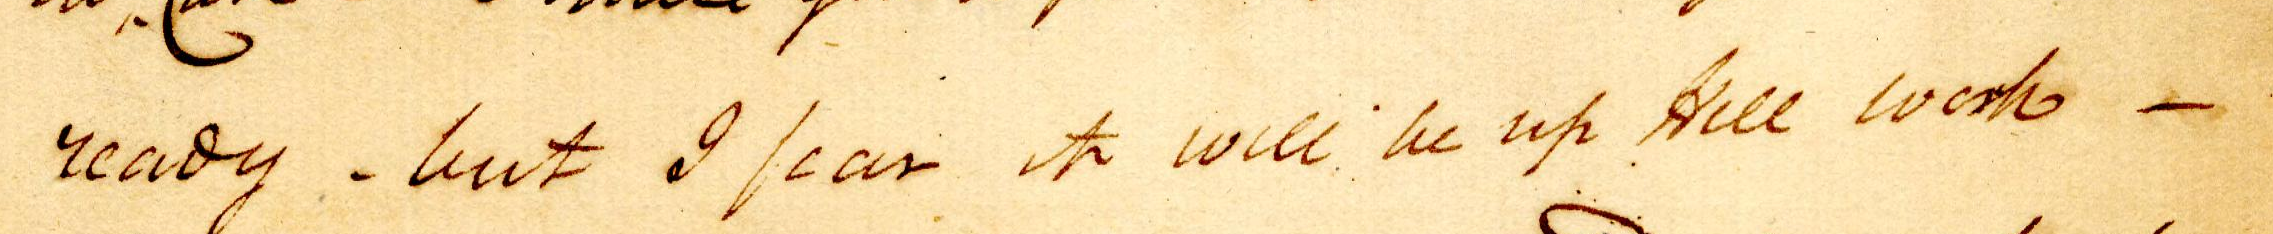ready but I fear it will be up Hill work.
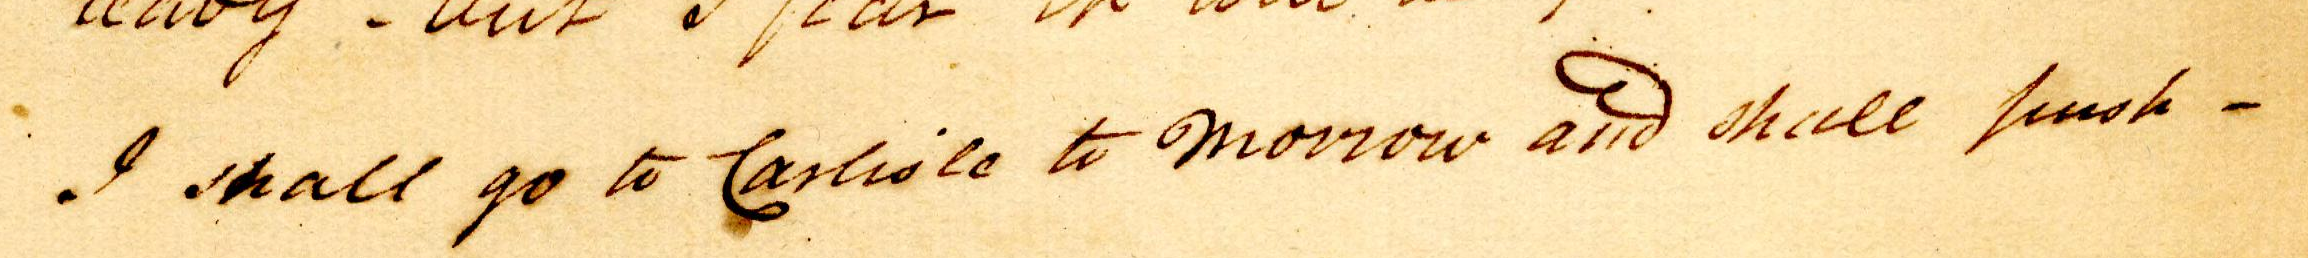I shall go to Carlisle to morrow and shall finish
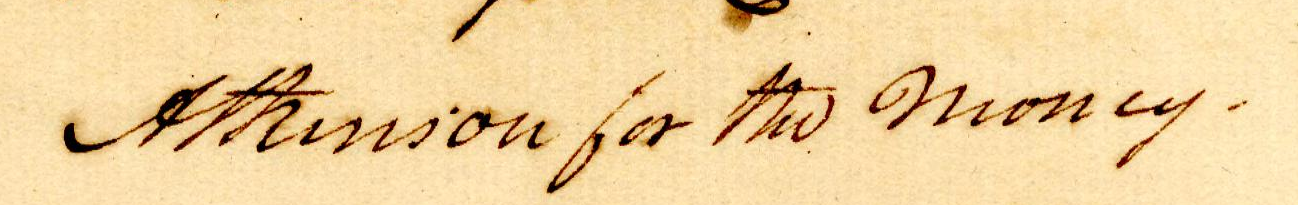Athenson for the money.
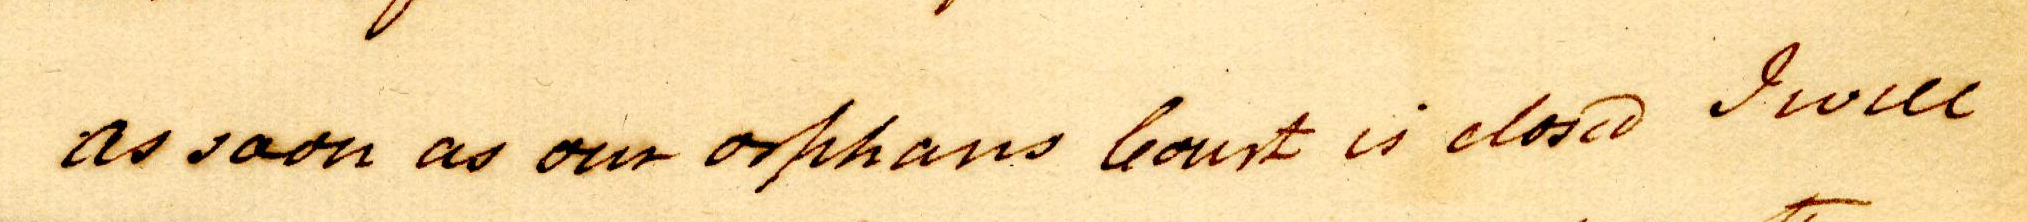as soon as our orphans Court is closed I will
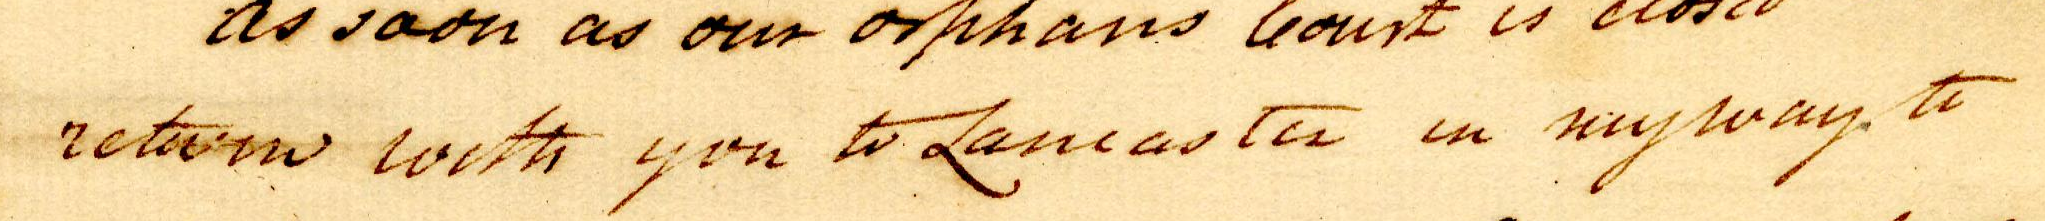return with you to Lancaster in my way to
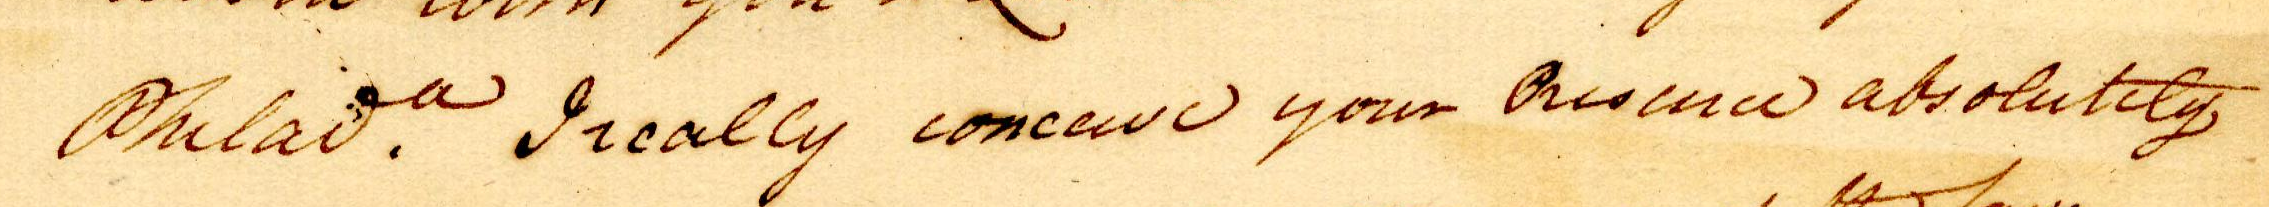Philad^a I really conceive your Presence absolutely
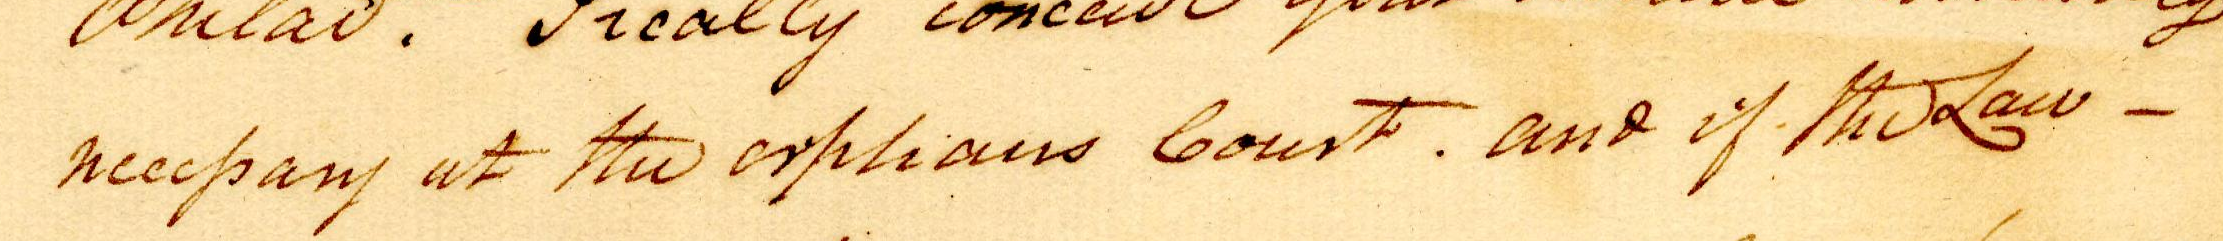necessary at the orphans Court. and if the Law
